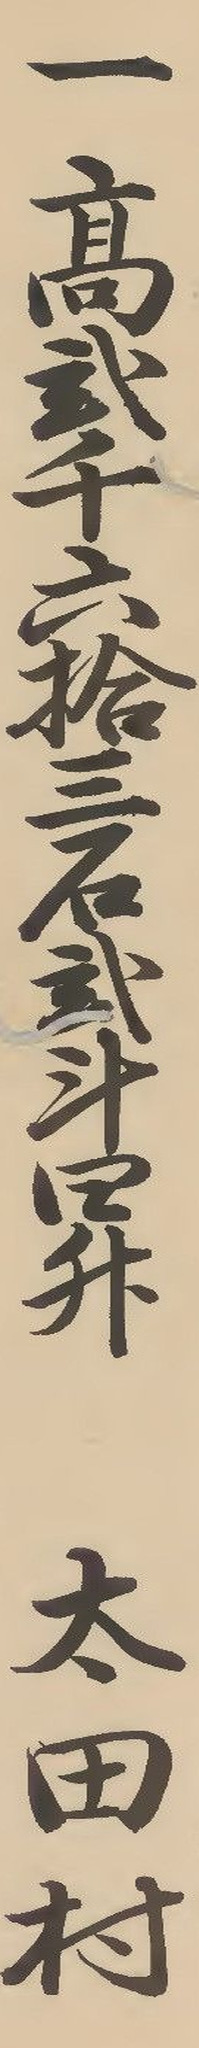一高弐千六拾三石弐斗四升太田村
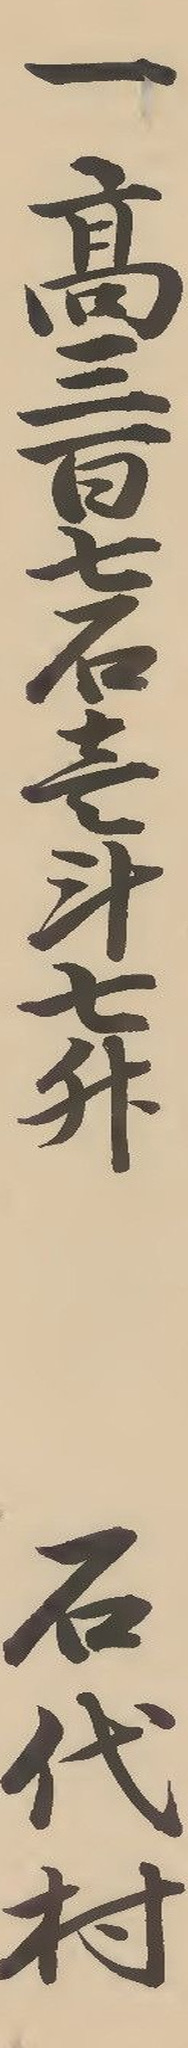一高三百七石壱斗七升石代村
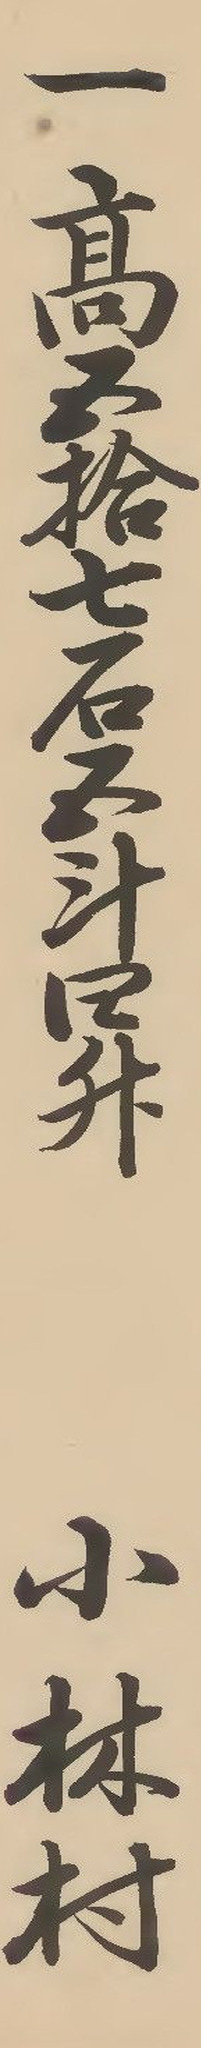一高五拾七石五斗四升小林村

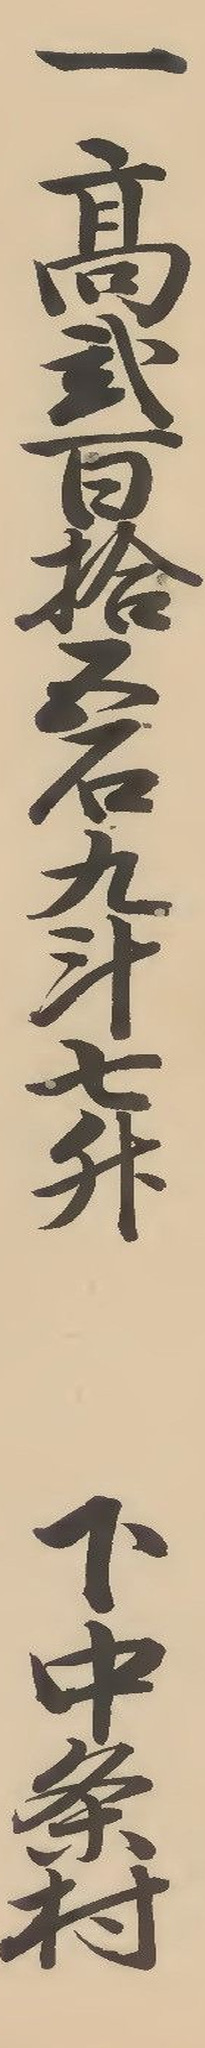一高弐百拾五石九斗七升下中条村
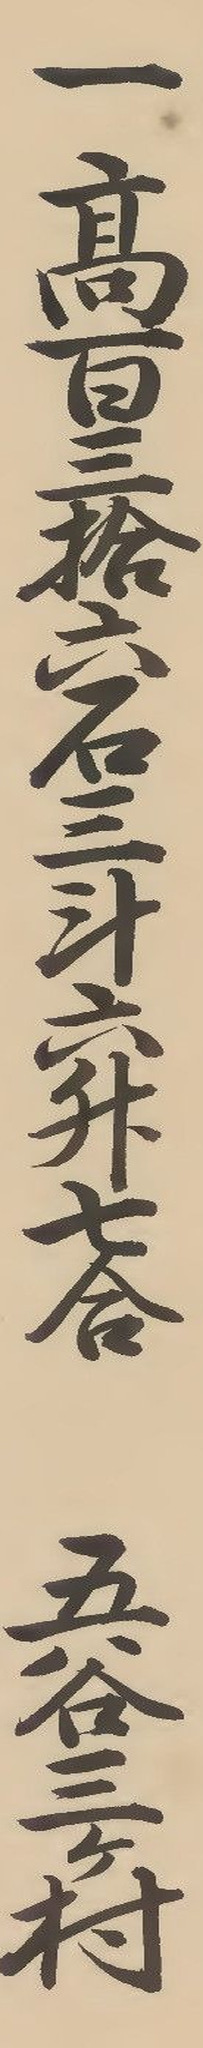一高百三拾六石三斗六升七合五谷三ヶ村
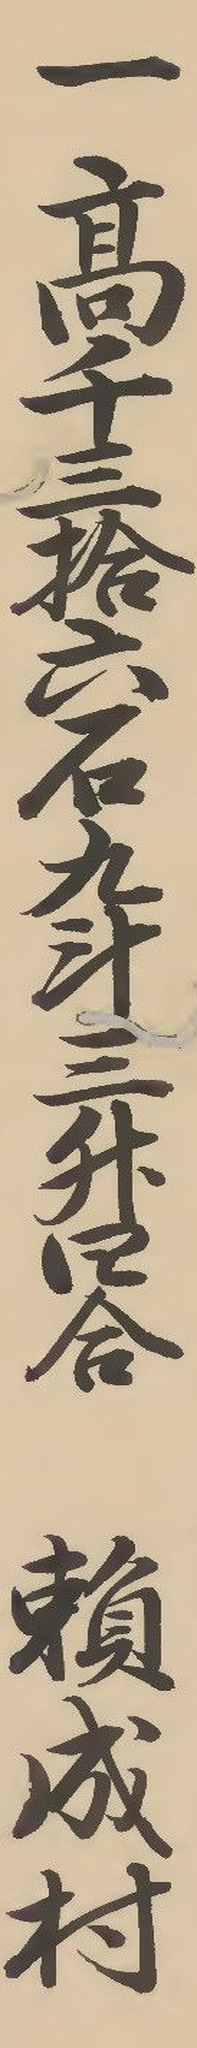一高千三拾六石九斗三升四合頼成村
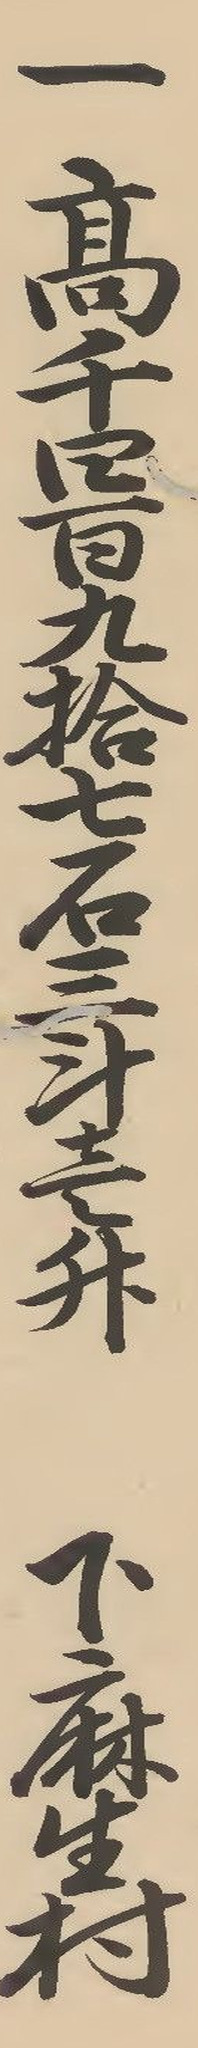一高千四百九拾七石三斗壱升下麻生村
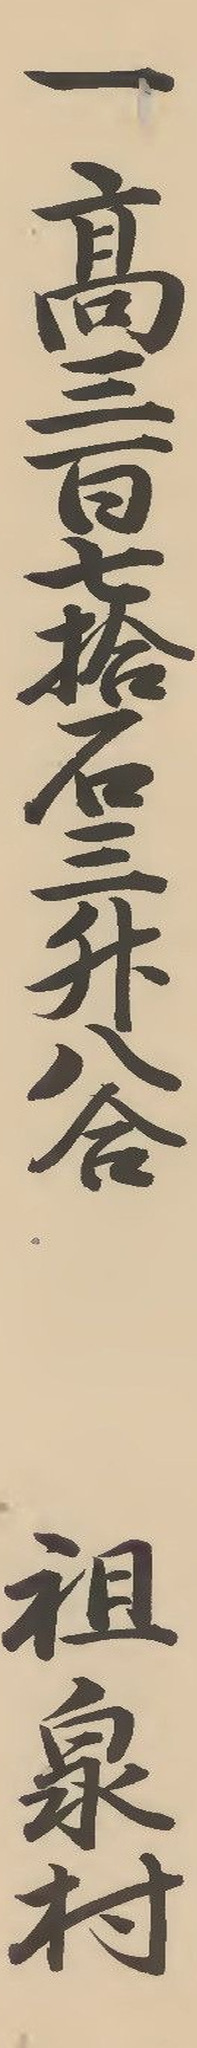一高三百七拾石三升八合祖泉村

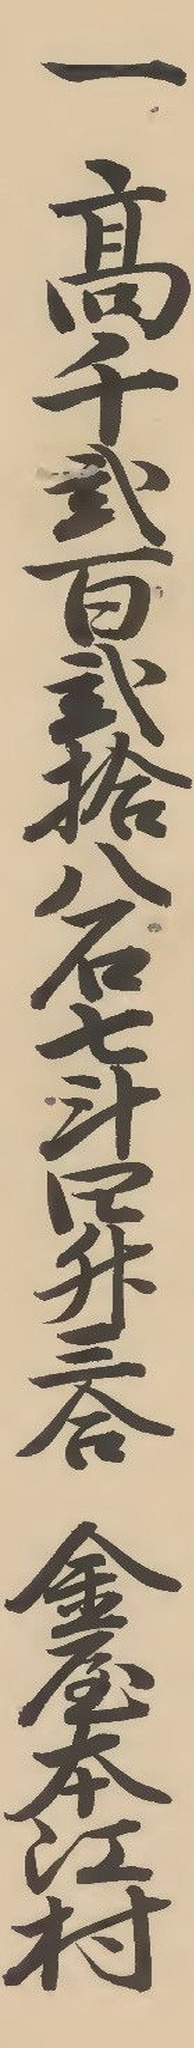一高千弐百弐拾八石七斗四升三合金屋本江村
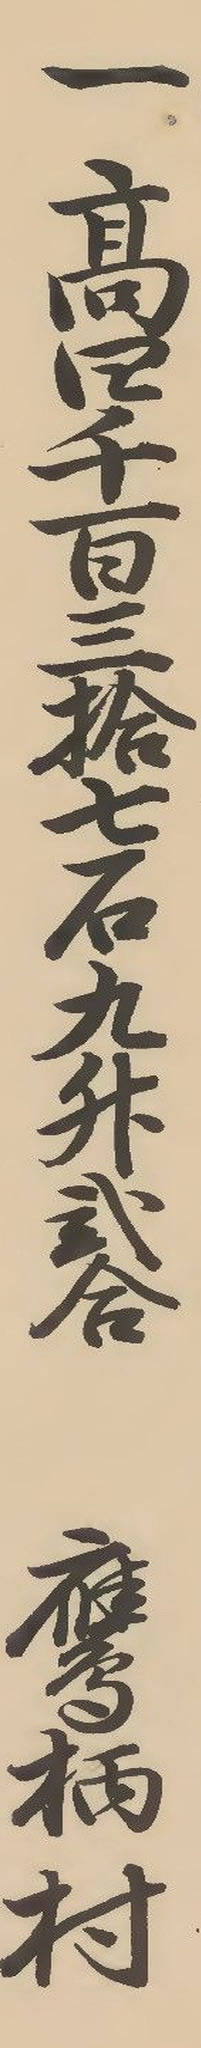一高四千百三拾七石九升弐合鷹柄村
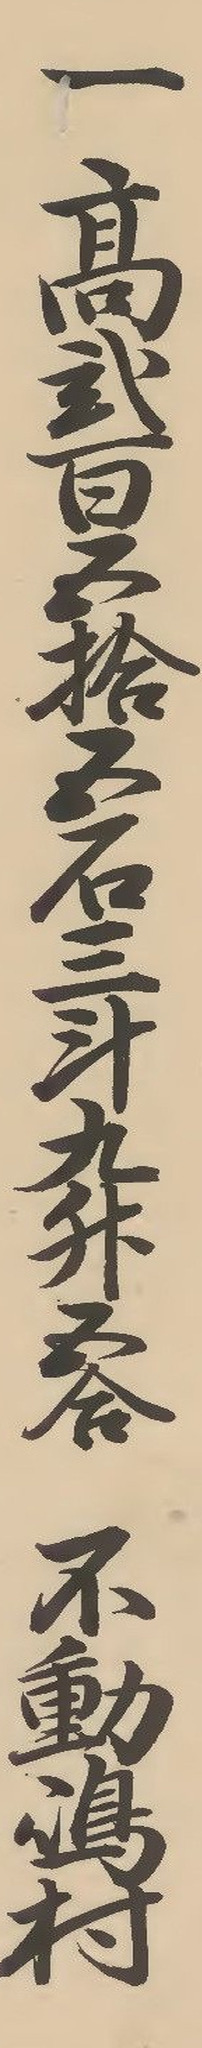一高弐百五拾五石三斗九升五合不動島村
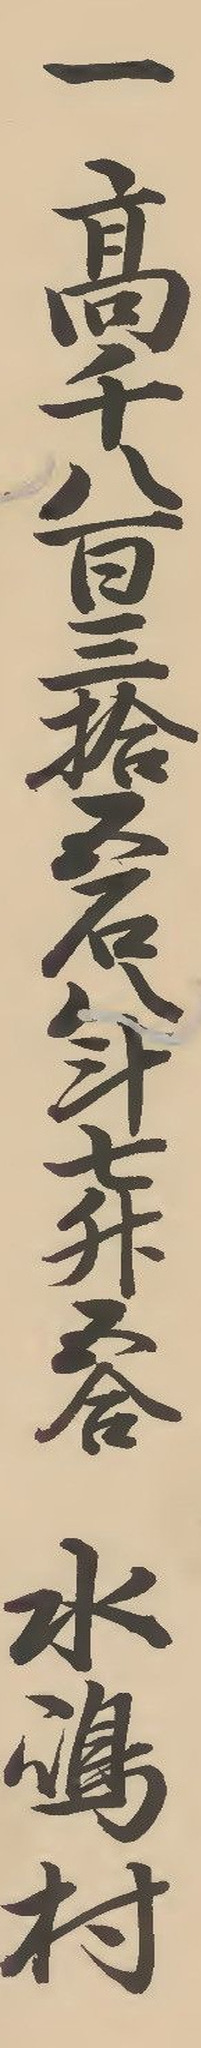一高千八百三拾五石八斗七升五合水島村
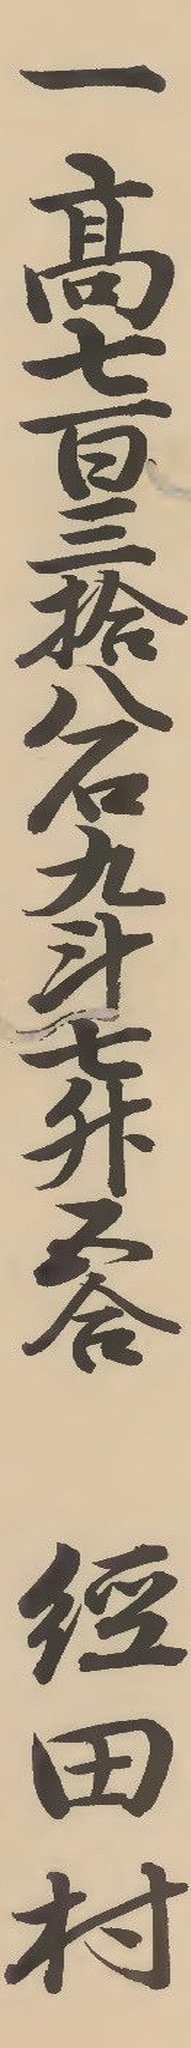一高七百三拾八石九斗七升五合経田村
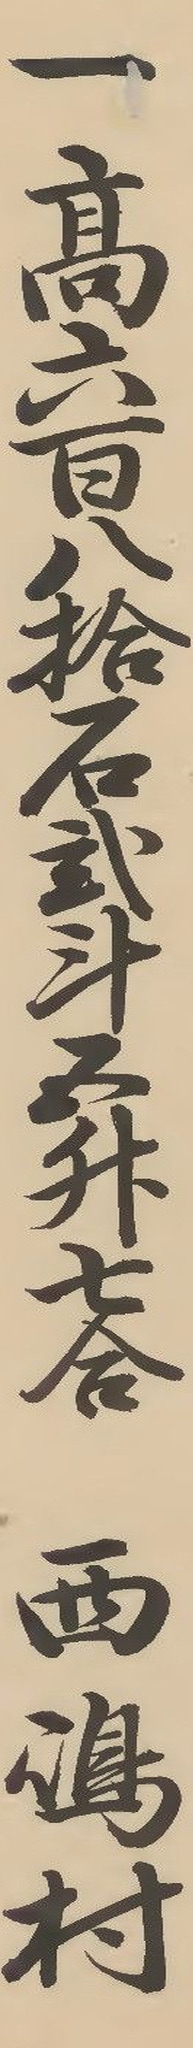一高六百八拾石弐斗五升七合西島村

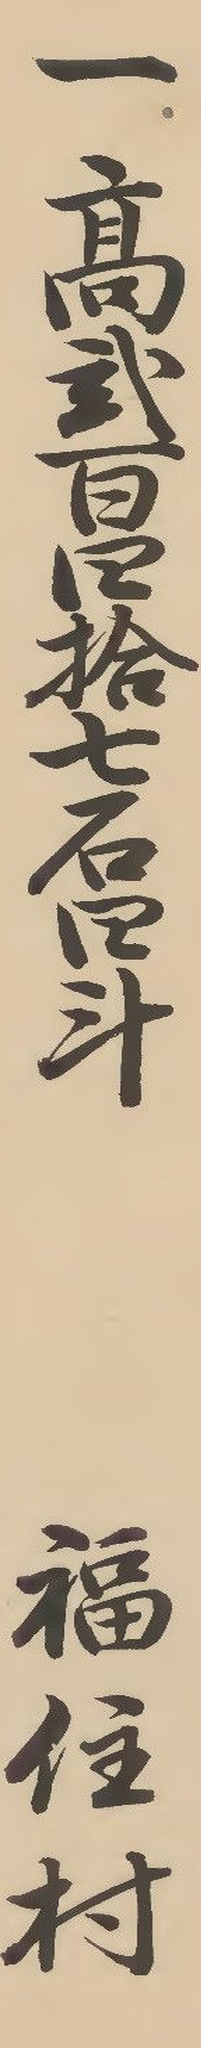一高弐百四拾七石四斗福住村
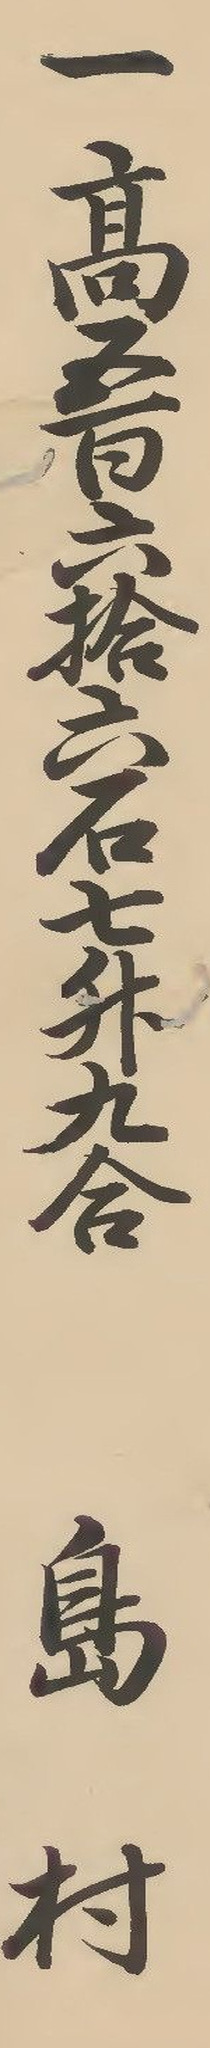一高五百六拾六石七升九合島村
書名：越中国郷帳
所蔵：国立公文書館 National Archives of Japan
